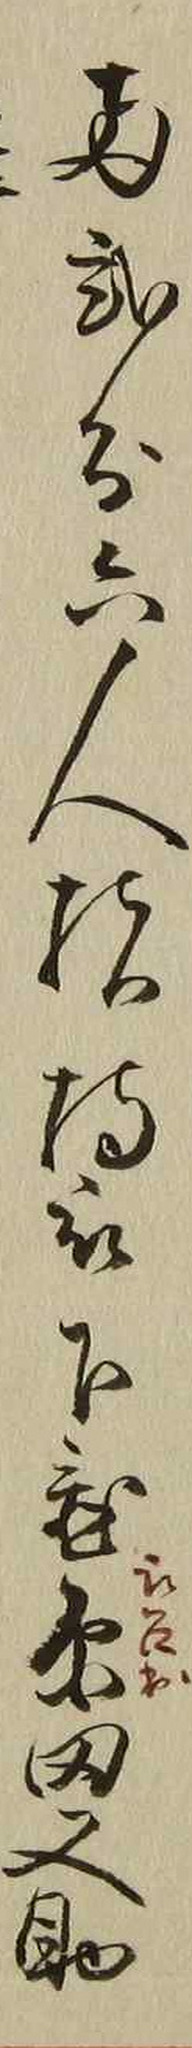両弐分六人扶持被下置原田又助
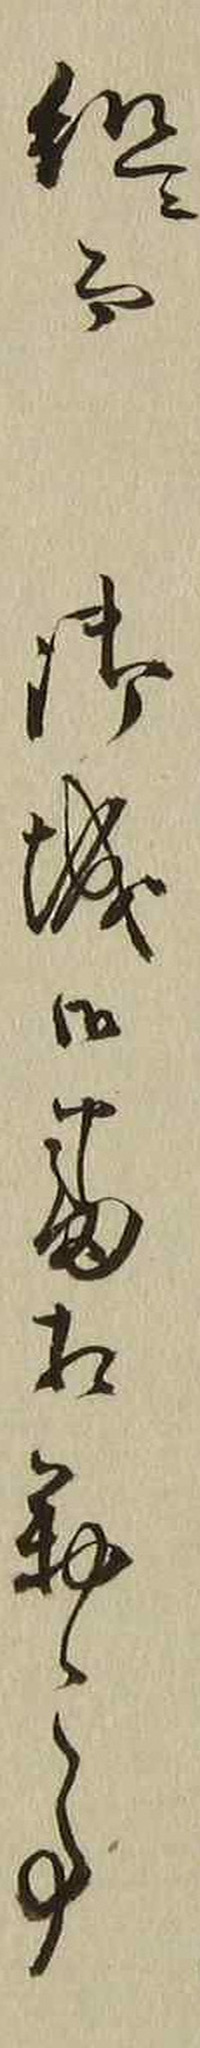組ニ而御城御番相勤候事
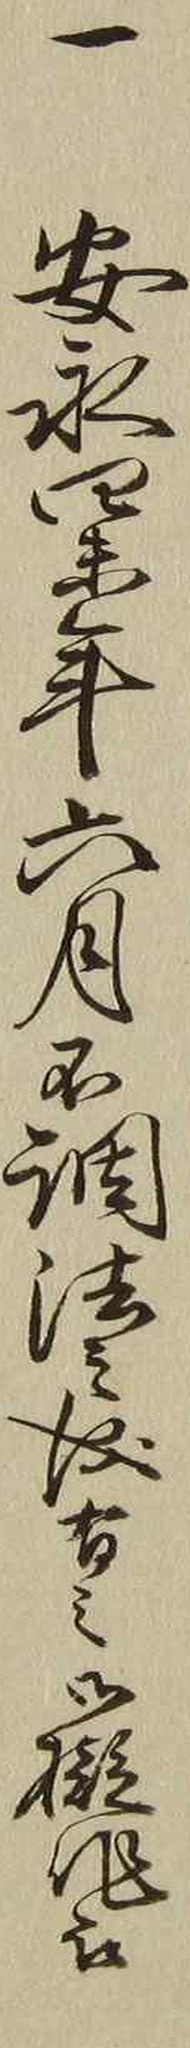一安永四未年六月不調法之儀有之御擬作被
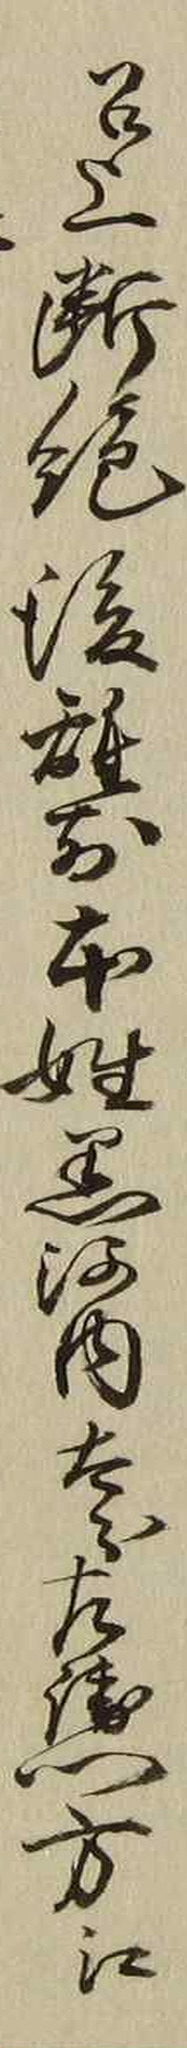召上断絶後離別本姓黒河内太郎左衛門方江
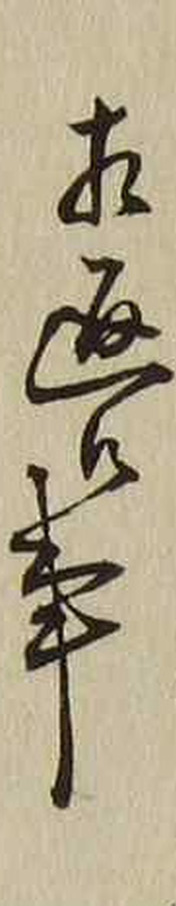相返候事
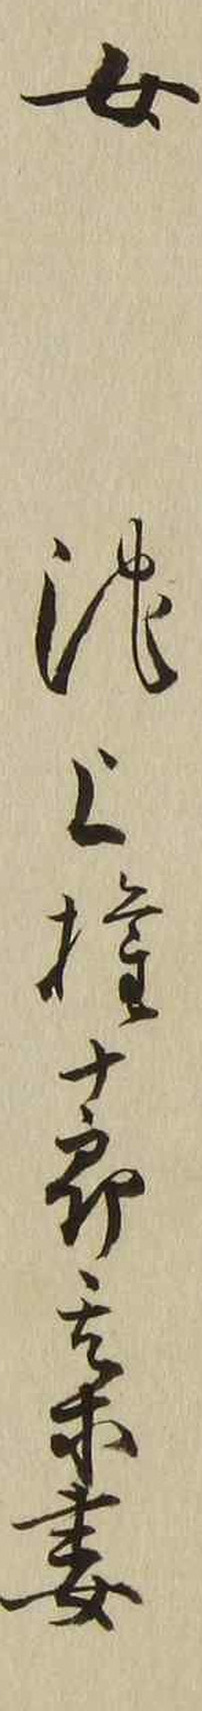女池上権十郎某妻
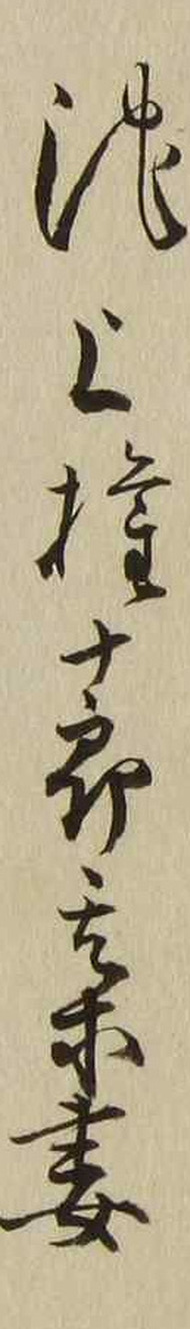女池上権十郎某妻
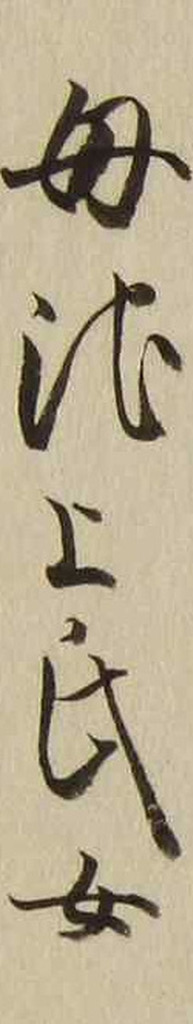母池上氏女

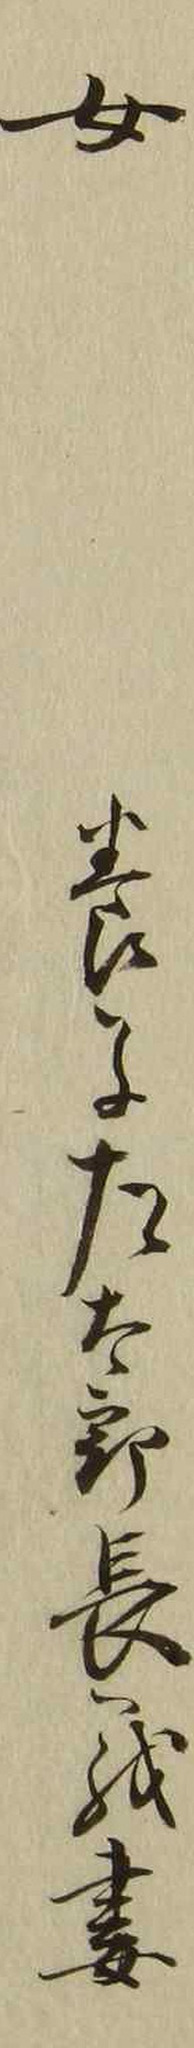女養子左太郎長義妻
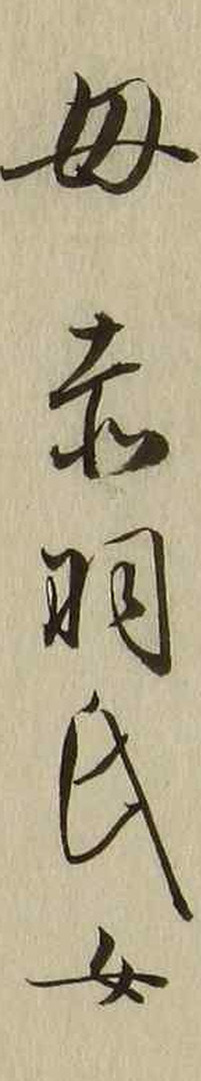母赤羽氏女
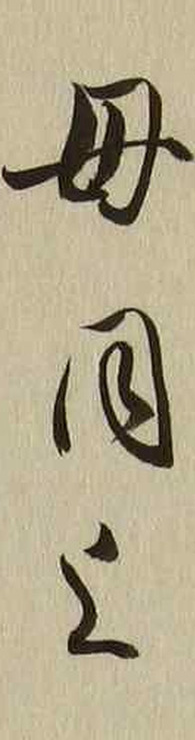母同上
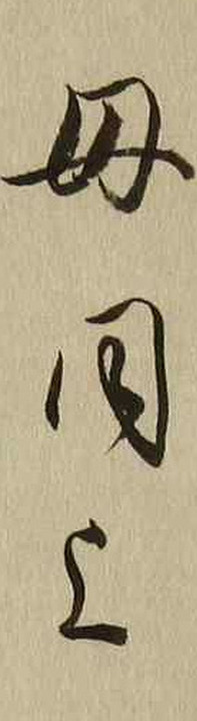母同上
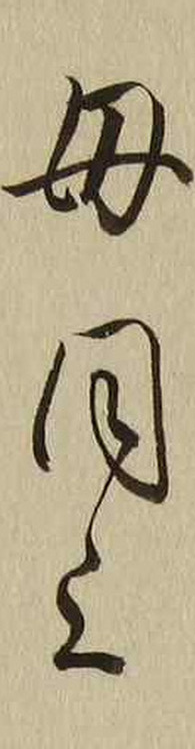母同上
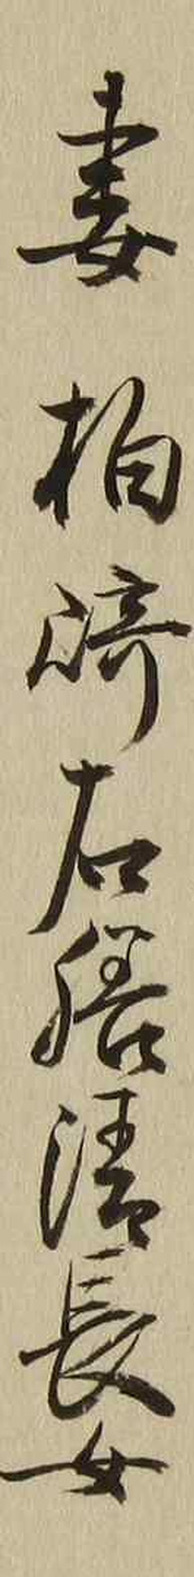妻柏崎右膳清長女
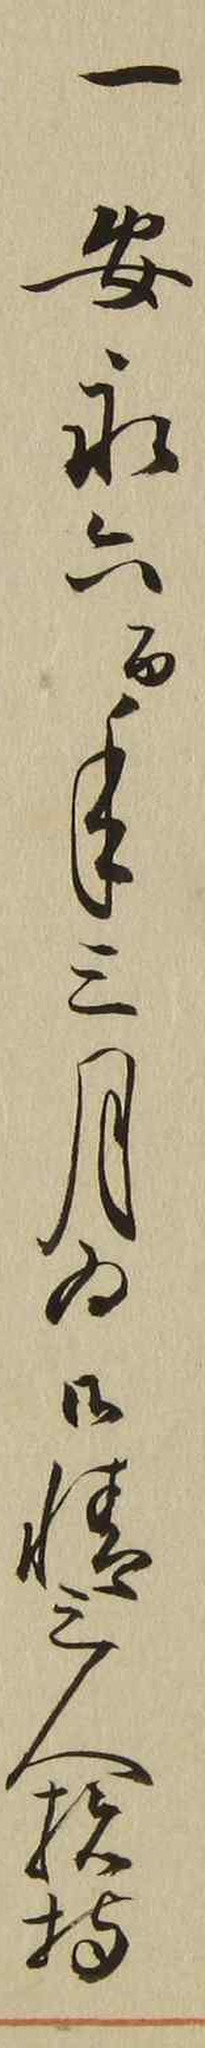一安永六酉年三月為御情三人扶持
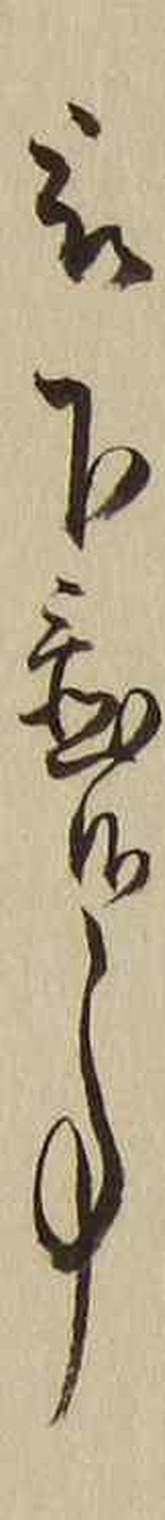被下置候事
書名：諸士系譜　巻之57　ほ之部4
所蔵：会津若松市立会津図書館
